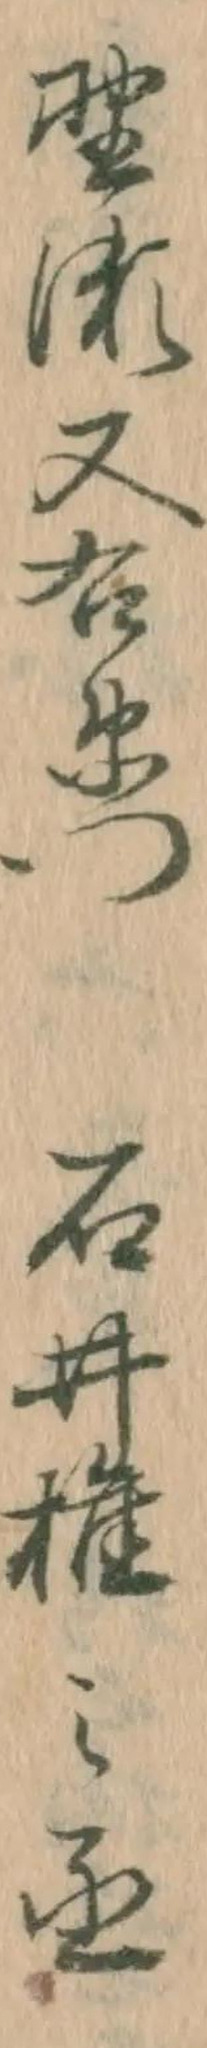野瀬又右衛門石井権之丞
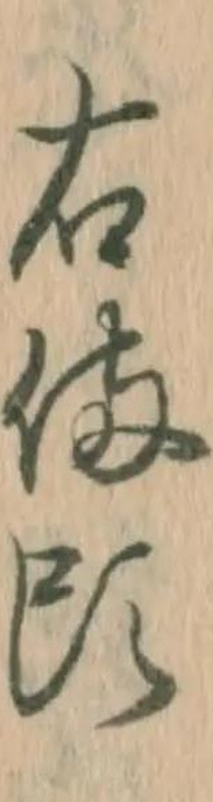右備頭
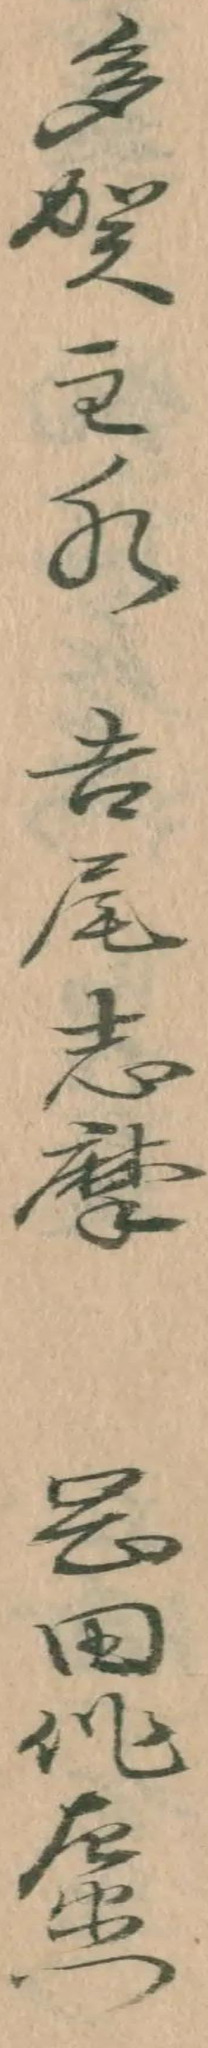多賀主水吉尾志摩岡田作左衛門
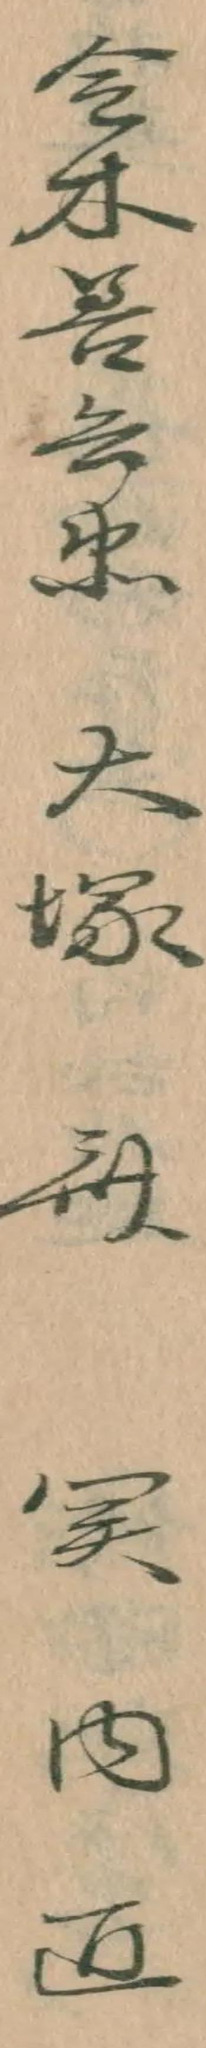鈴木善兵衛大塚斎関内匠
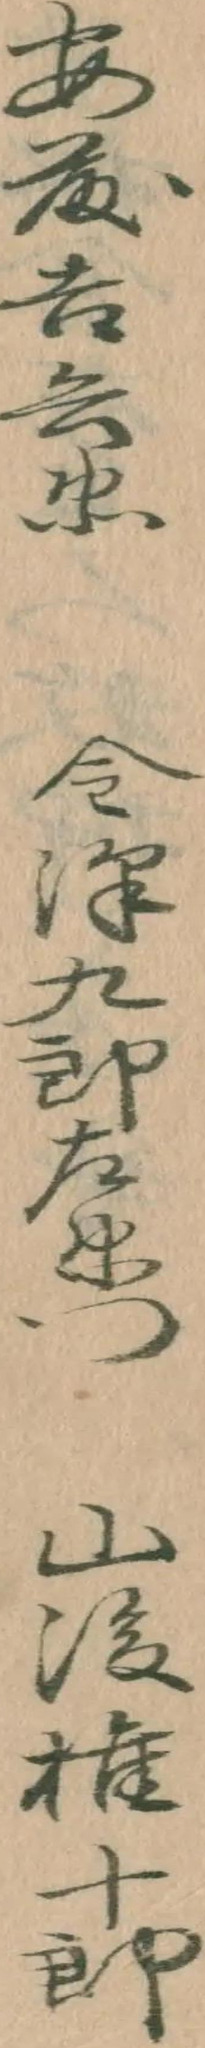安藤吉兵衛金沢九郎左衛門山後権十郎
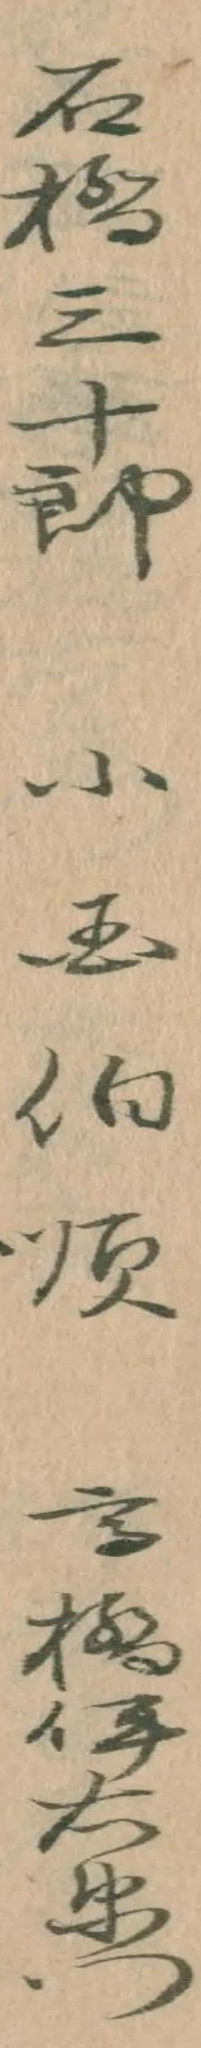石橋三十郎小国伯順高橋伊右衛門
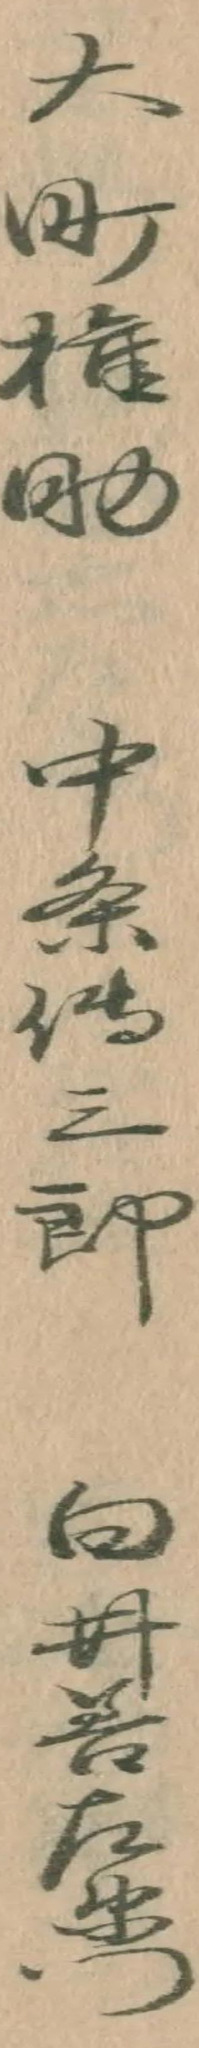大町権助中条伝三郎白井善左衛門
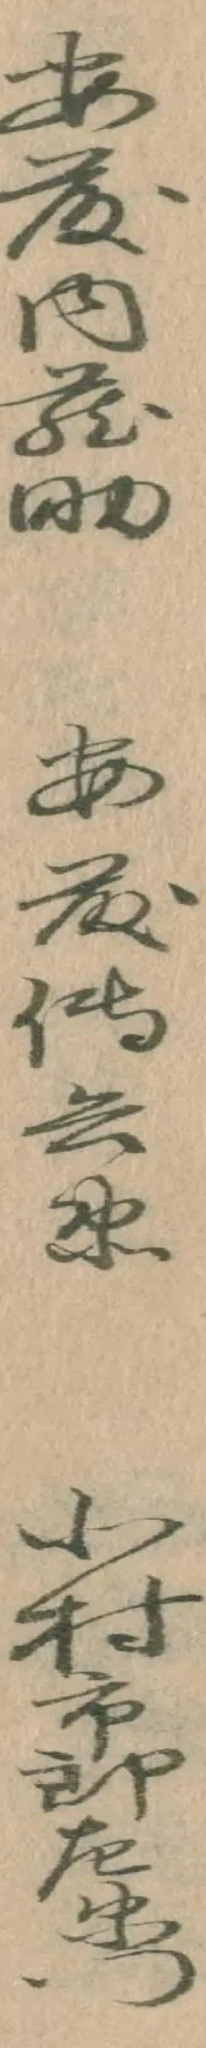安藤内蔵助安藤伝兵衛北村市郎左衛門
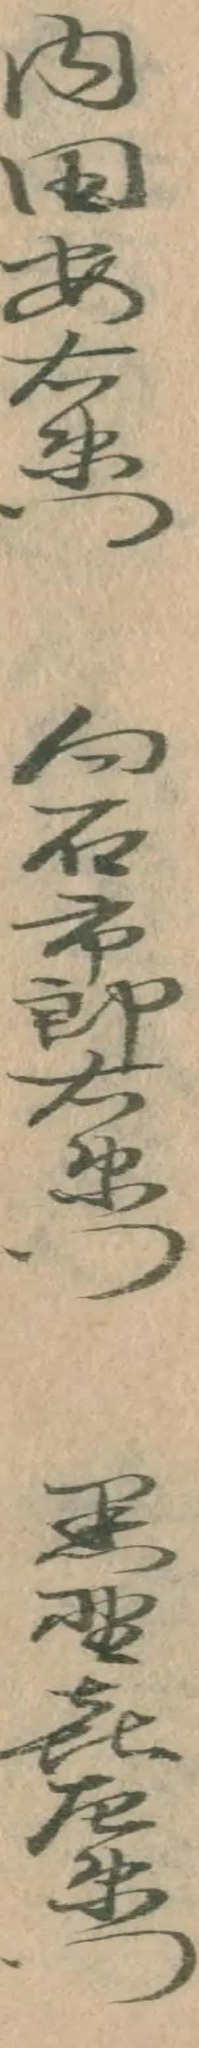内田安右衛門向石市郎右衛門黒野喜左衛門
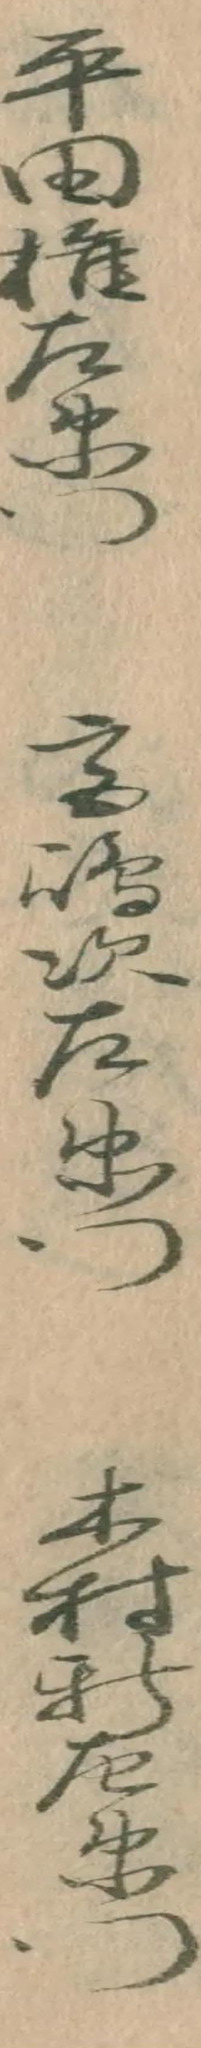平田権左衛門宮島次左衛門木村新左衛門
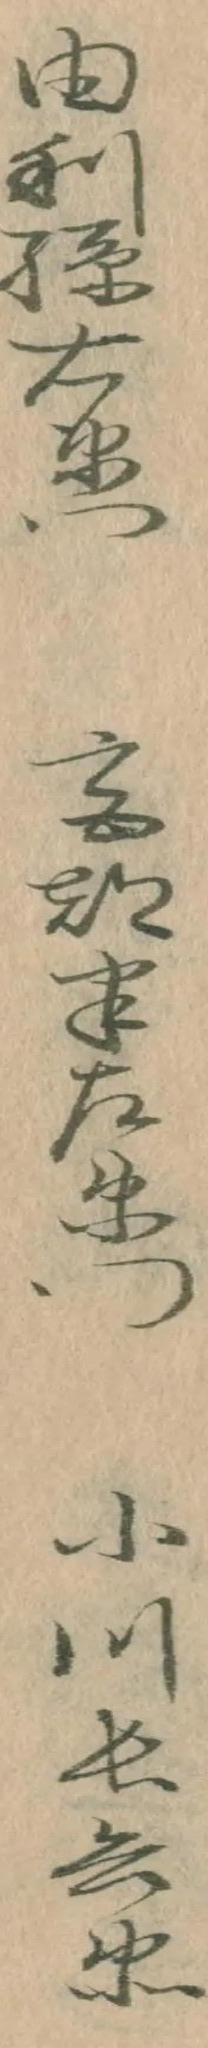由利孫右衛門宮部半左衛門小川長兵衛
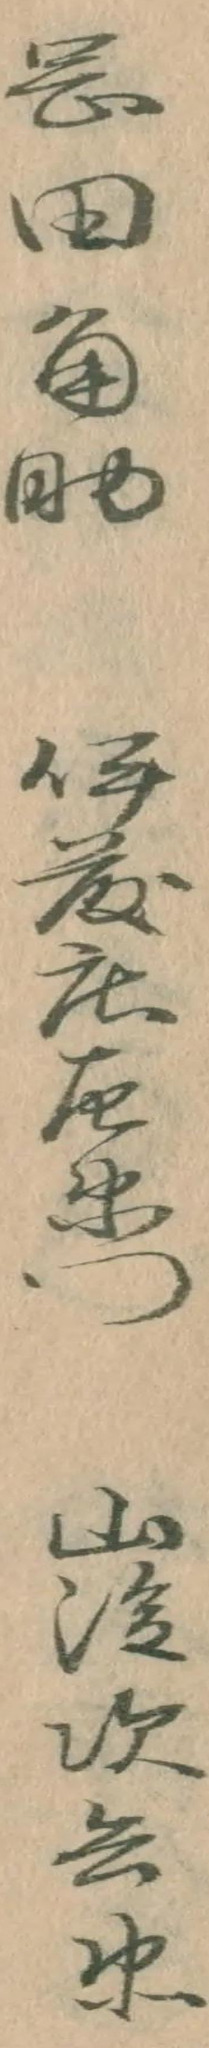岡田角助伊藤庄左衛門山後次兵衛
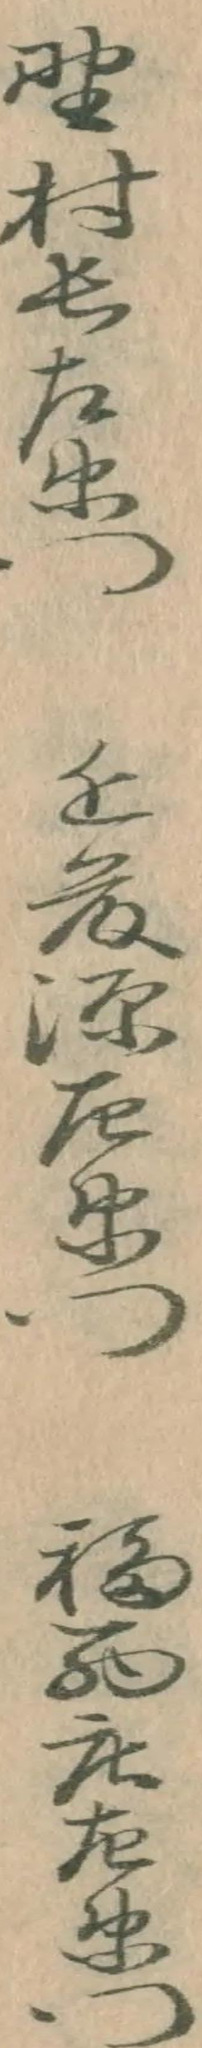野村長左衛門近藤源左衛門福西庄左衛門
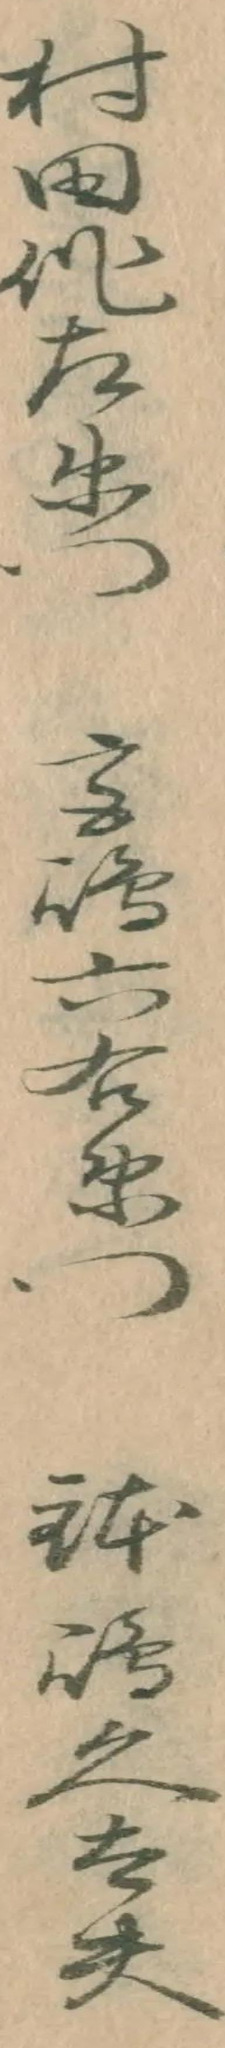村田作左衛門宮島六右衛門鉢島久太夫

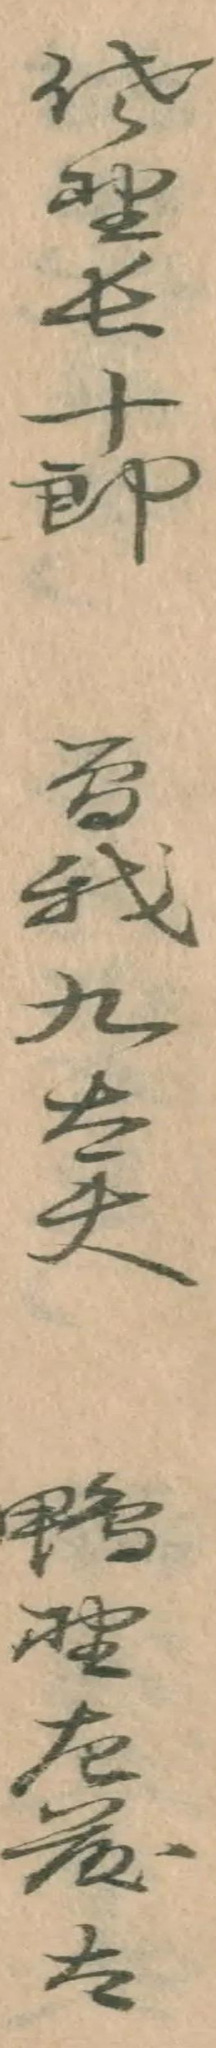佐野長十郎曽我九太夫鴨野左藤太
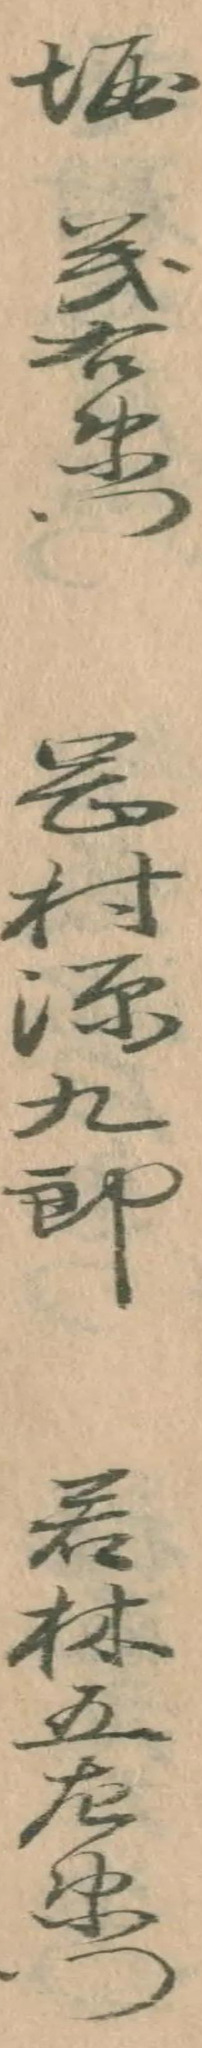堀義右衛門岡村源九郎若林五左衛門
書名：切支丹御退治記 49巻. [3]
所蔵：国立国会図書館 National Diet Library, JAPAN
